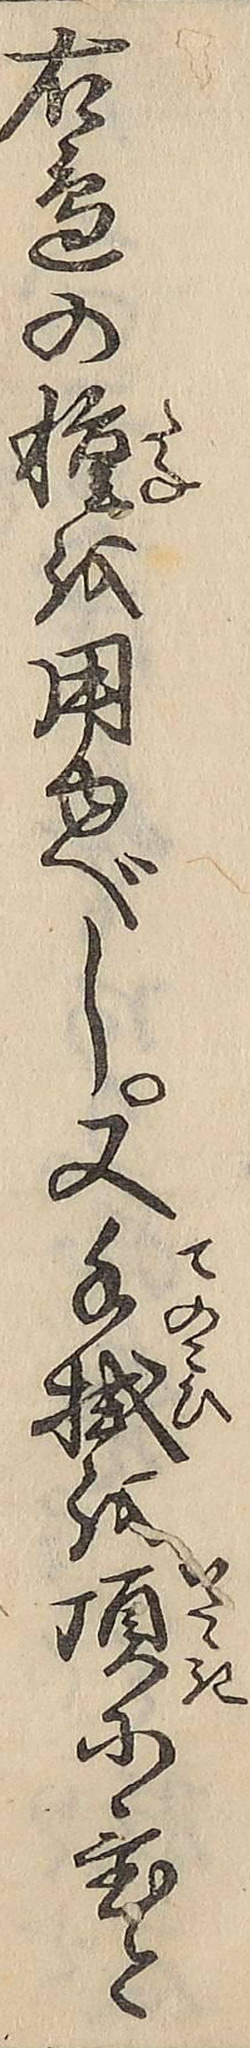右辺の種を用ゆべし。又手拭を頂に置と
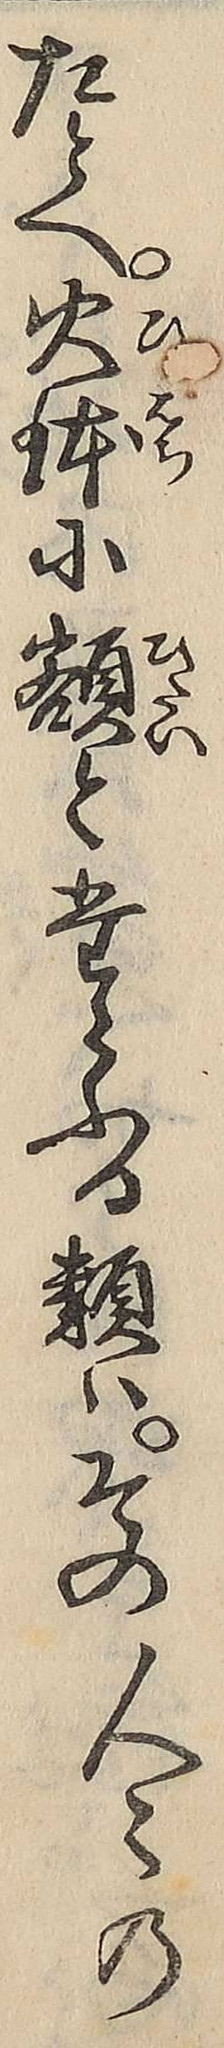たとへ。火鉢に額とたとふる類は。その人々の
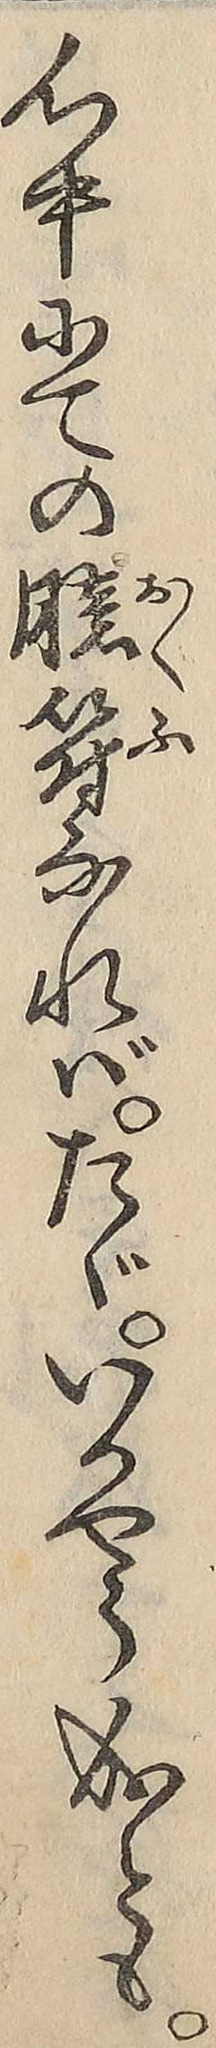心中にての臆符なれば。たゞ。いかやう成とも。
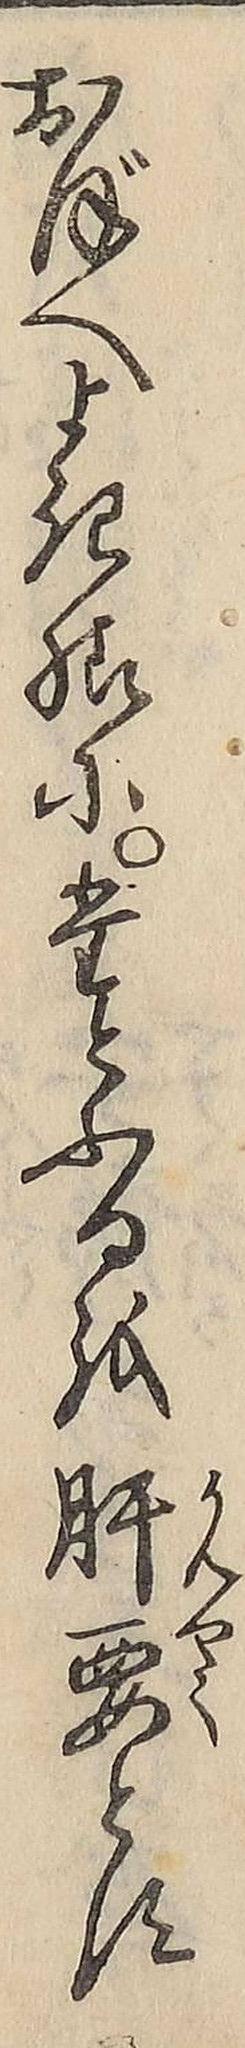おぼへよき様に。たとふるを肝要とす
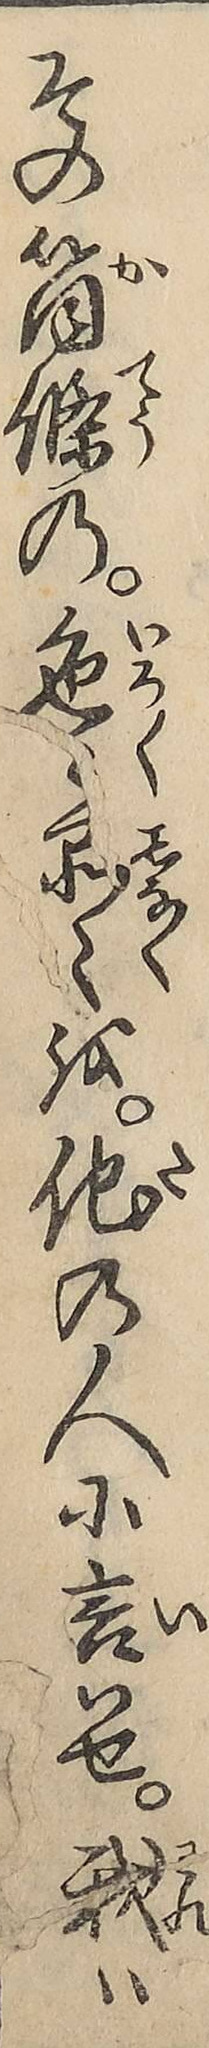その箇條の。色々品々を。他の人に言はせ。我は

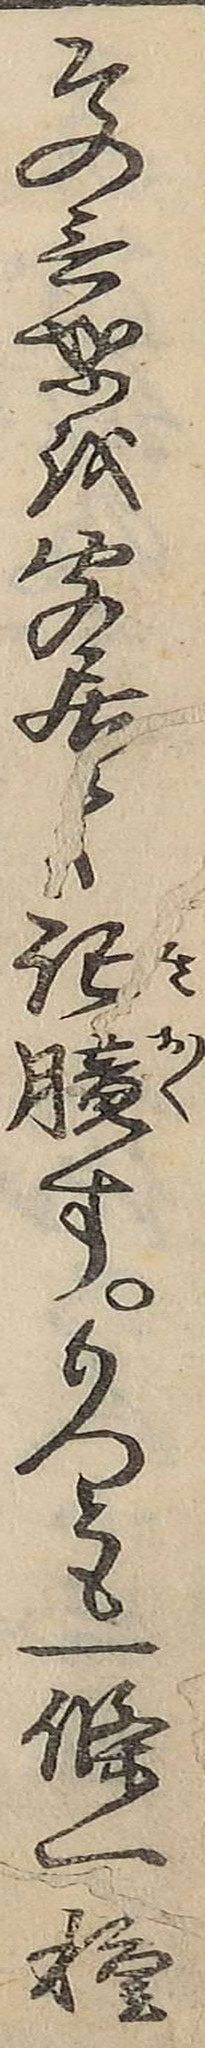その言葉を聞居て記臆す。もつとも一條一種
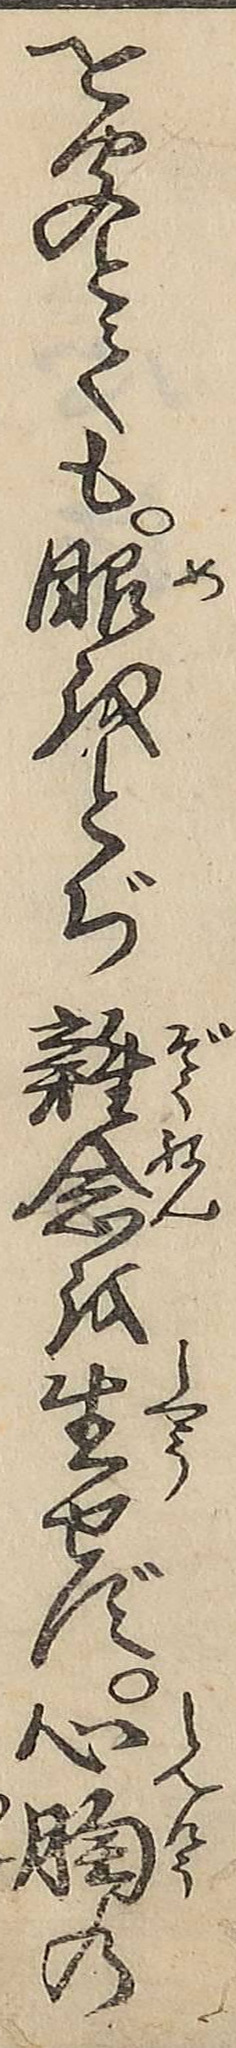を聞とても。眼をとぢ雑念を生せず。心胸の
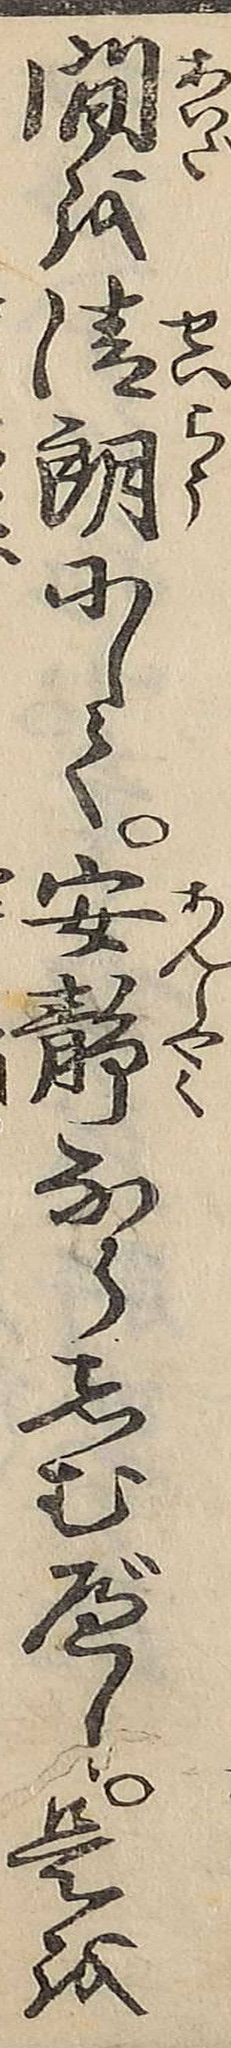間を晴朗にして。安静ならしむべし。是を
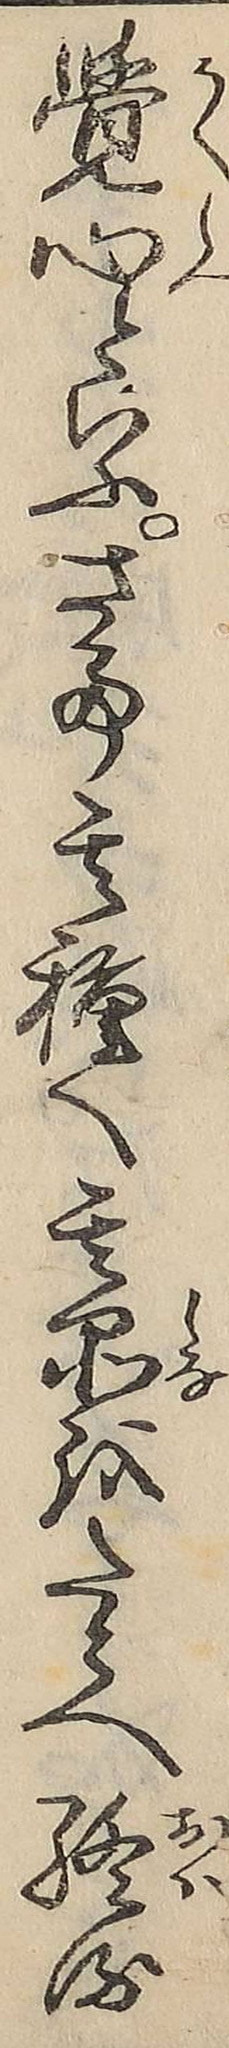覚心といふ。さて其種へ其品をたとへ終る
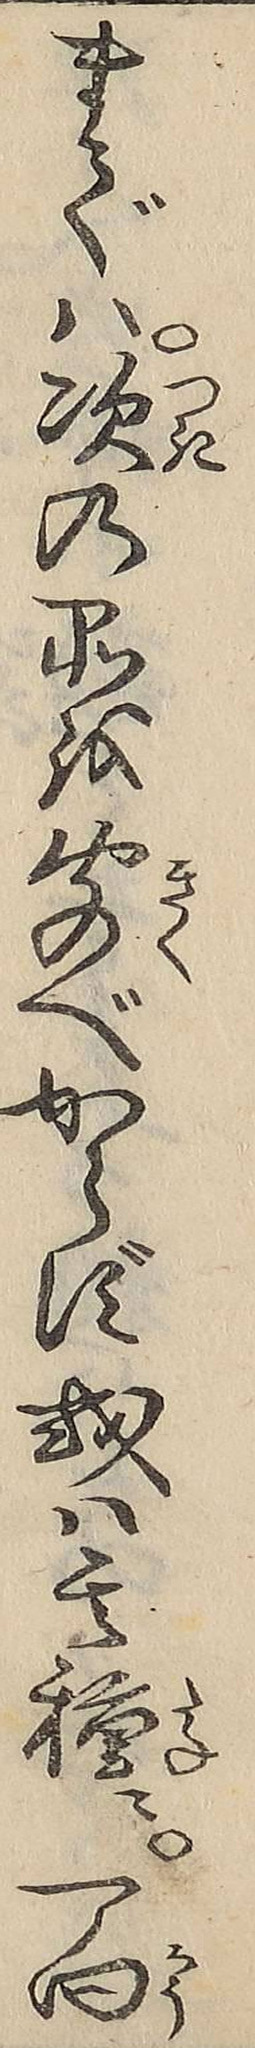までは。次の品を聞べからず或は其種に。一向
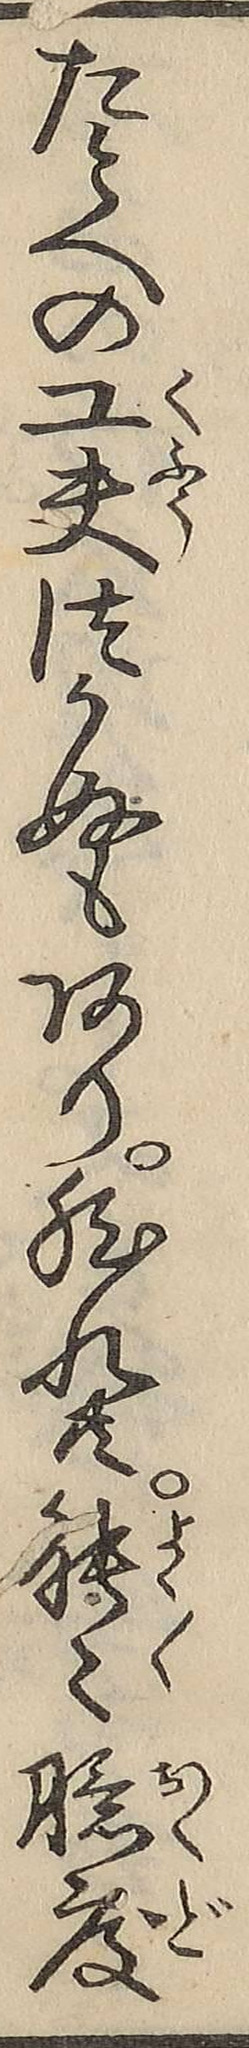たとへの工夫つかぬもあり。然れ共。能々臆度
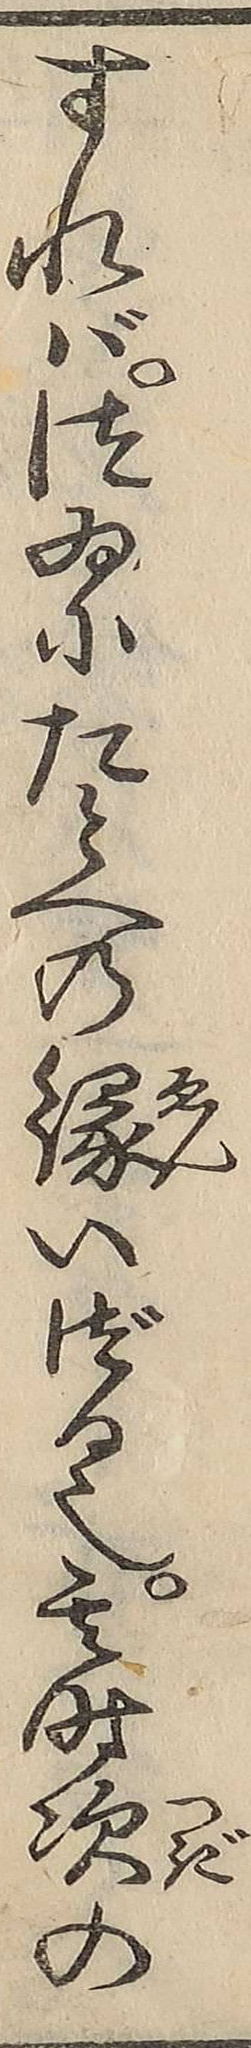すれば。つゐにたとへの縁いづる也。其時次の
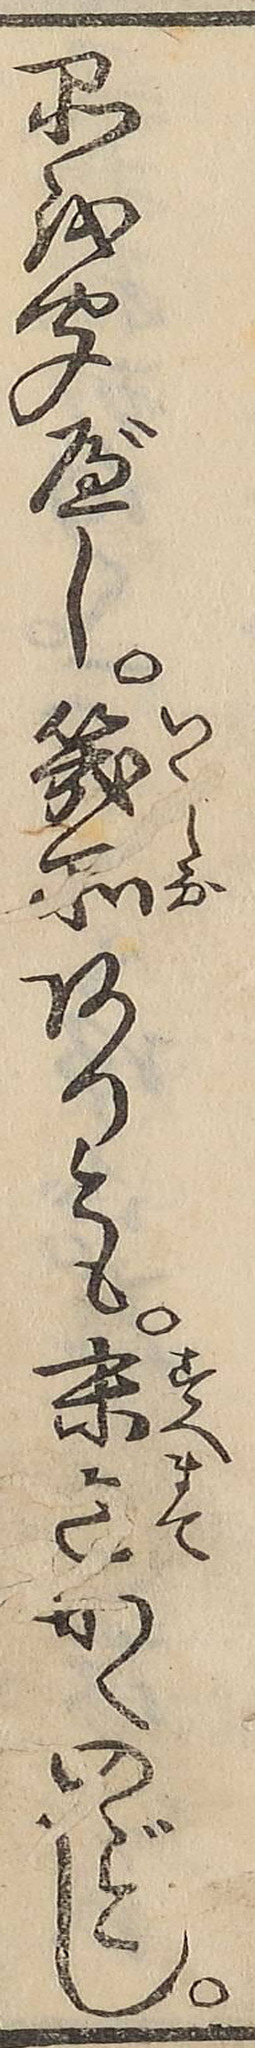品を聞べし。幾品ありとも。末迄かくのごとし。
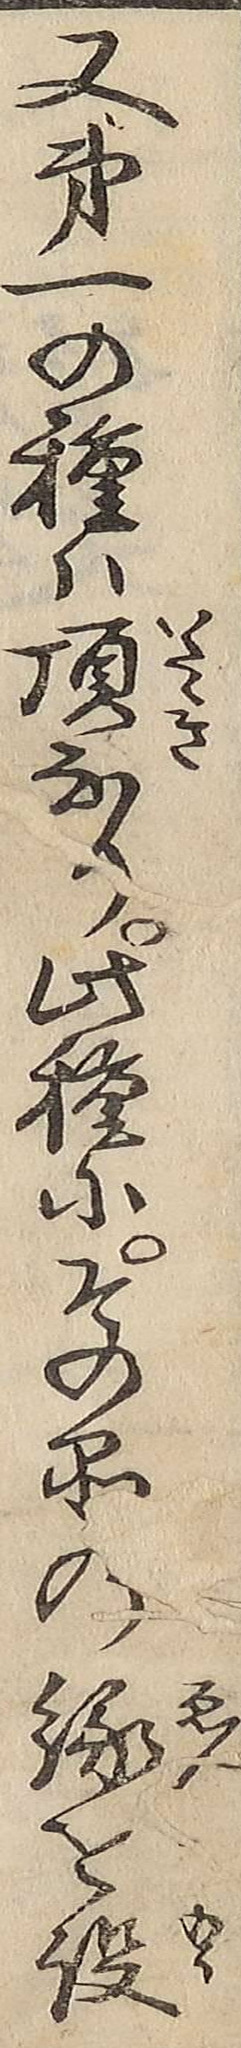又第一の種は頂なり。此種に。その品の縁を設
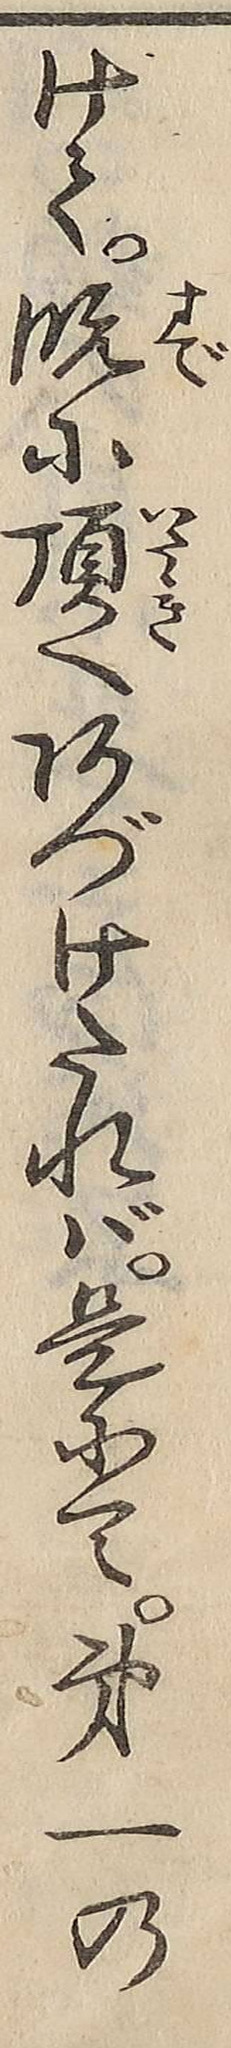けて。既に頂へあづけたれば。是にて。第一の
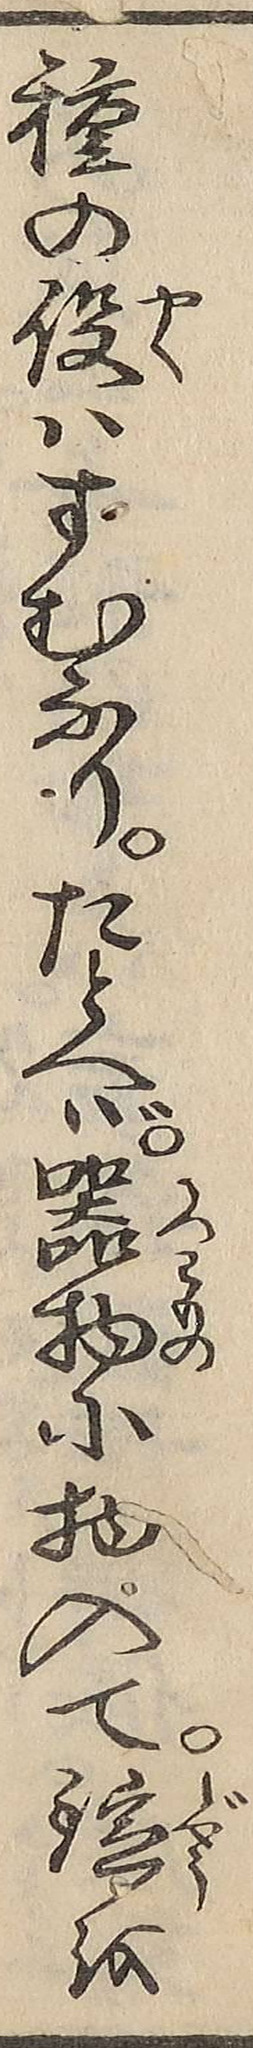種の役はすむなり。たとへば。器物に物入て。錠を
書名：物覺秘傳
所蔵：神戸大学附属図書館 国文学研究資料館
